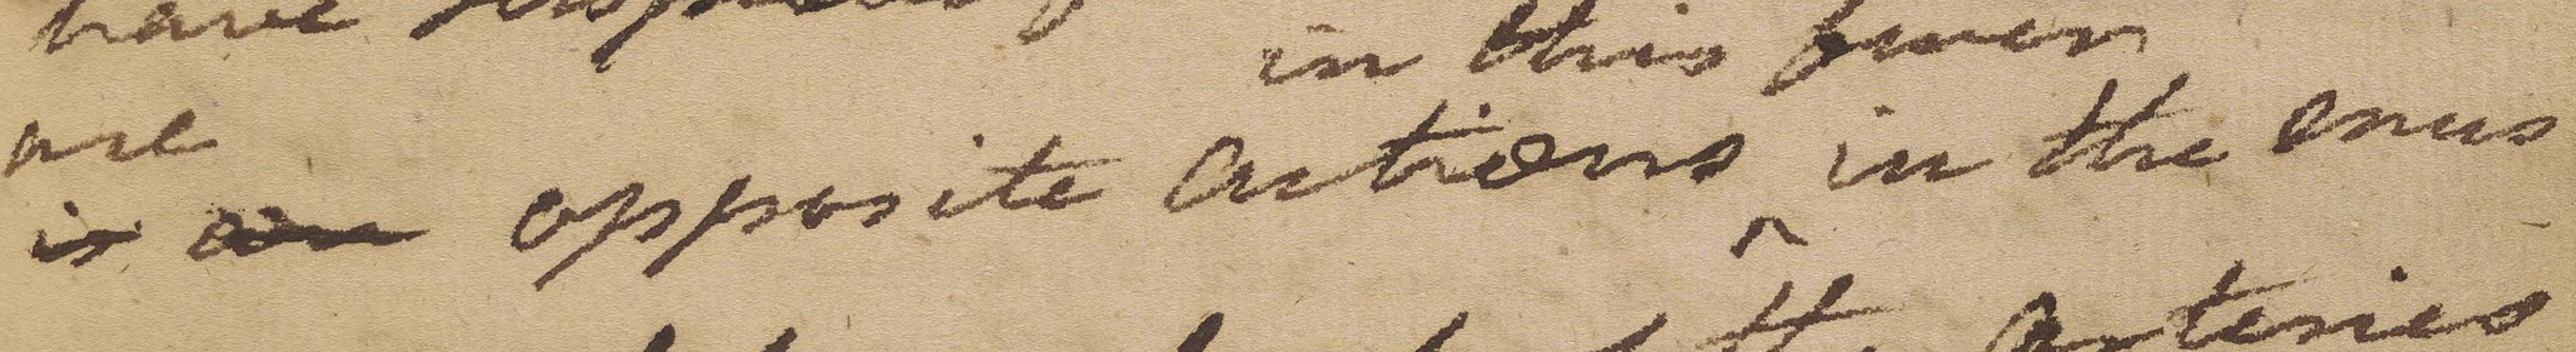[is] [an] opposite actions in the mus-
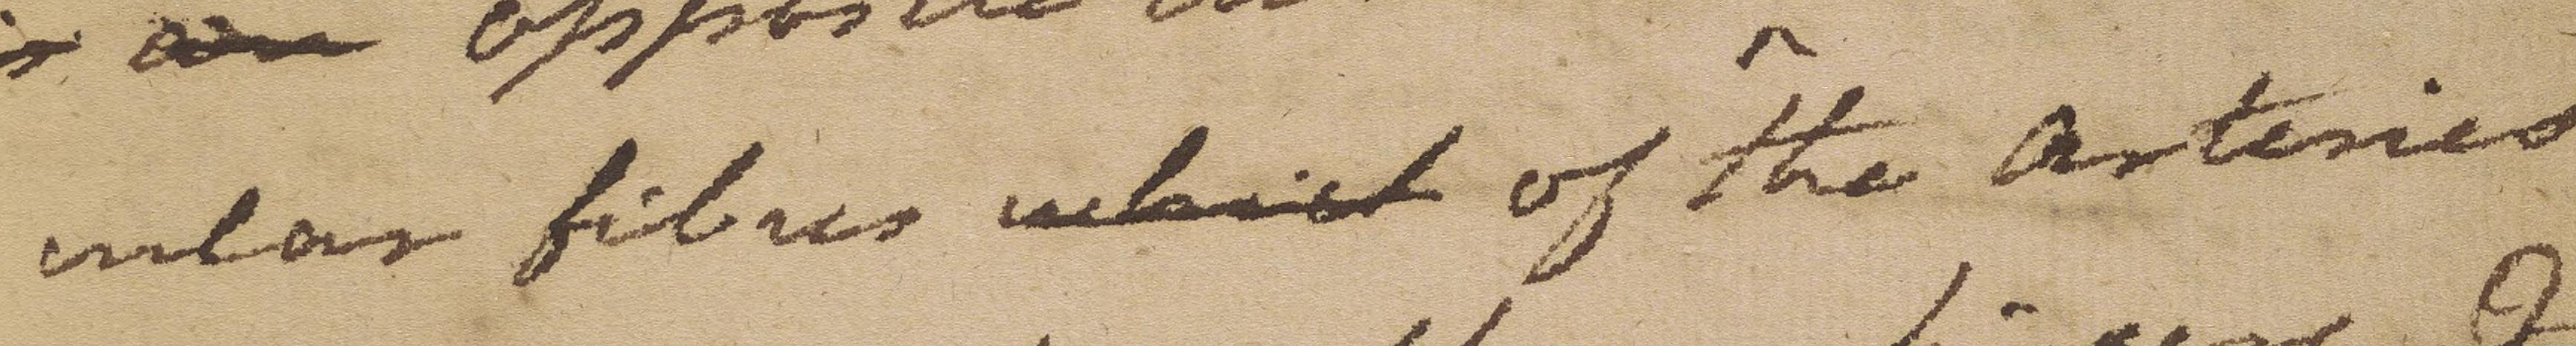-cular fibres [which] of the arteries
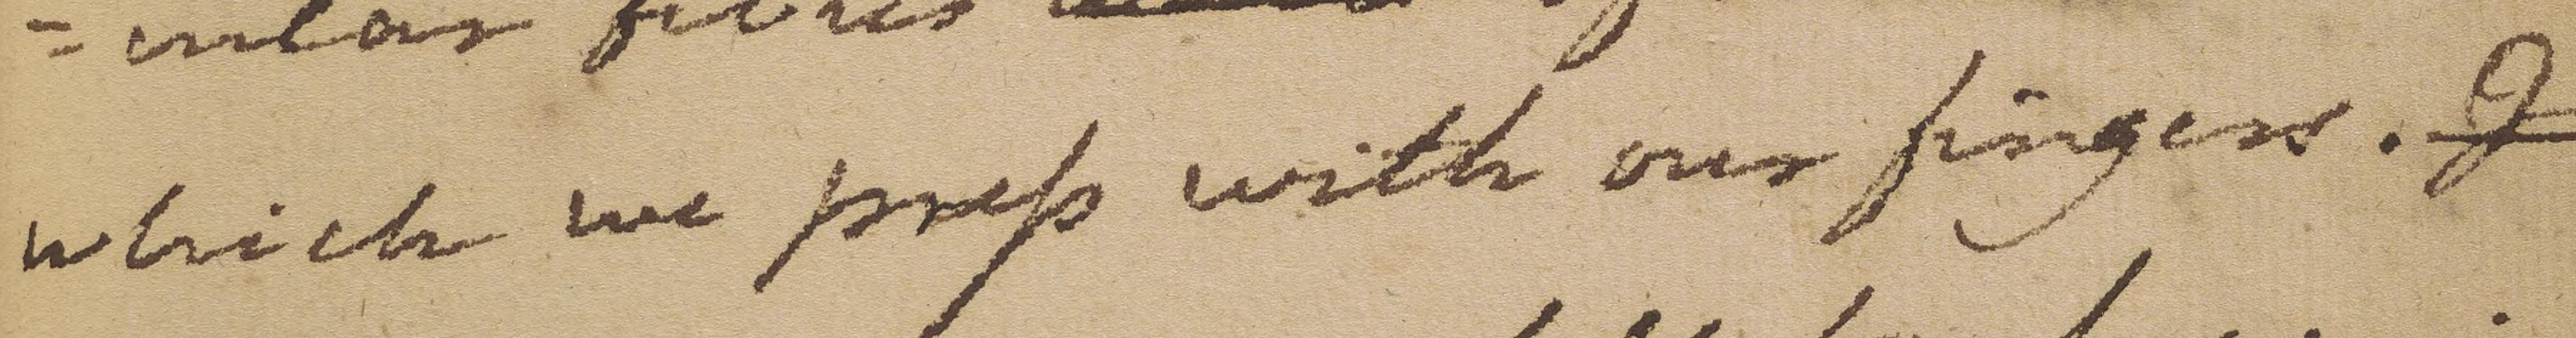which we prep with our finger. I
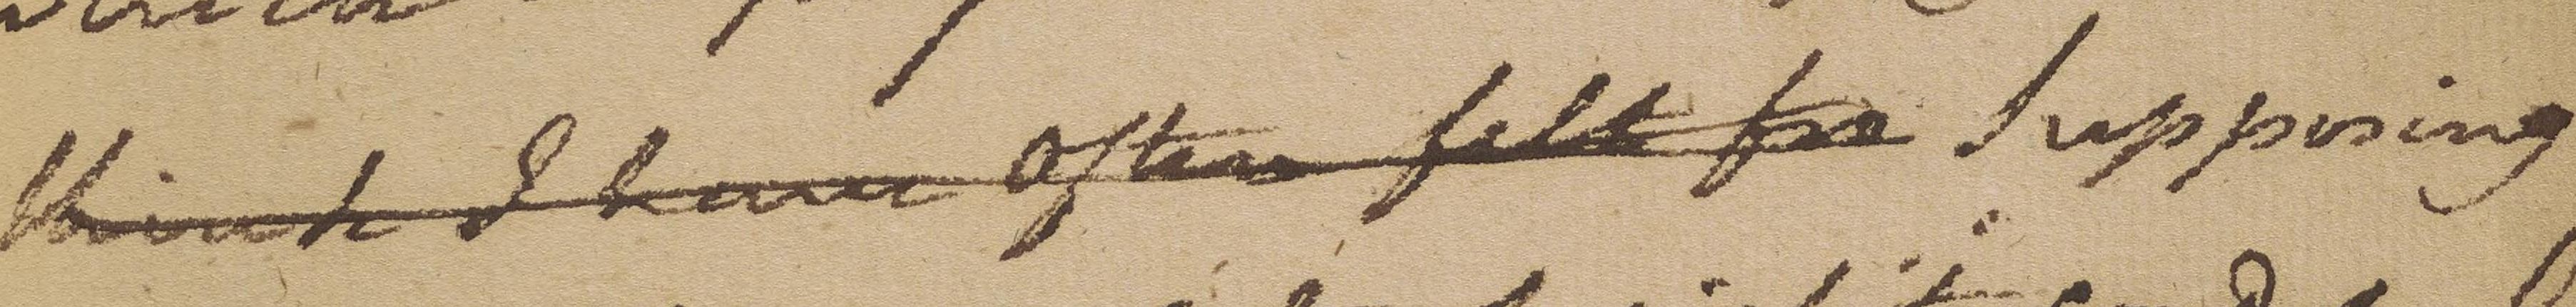[think I have often felt for] supposing
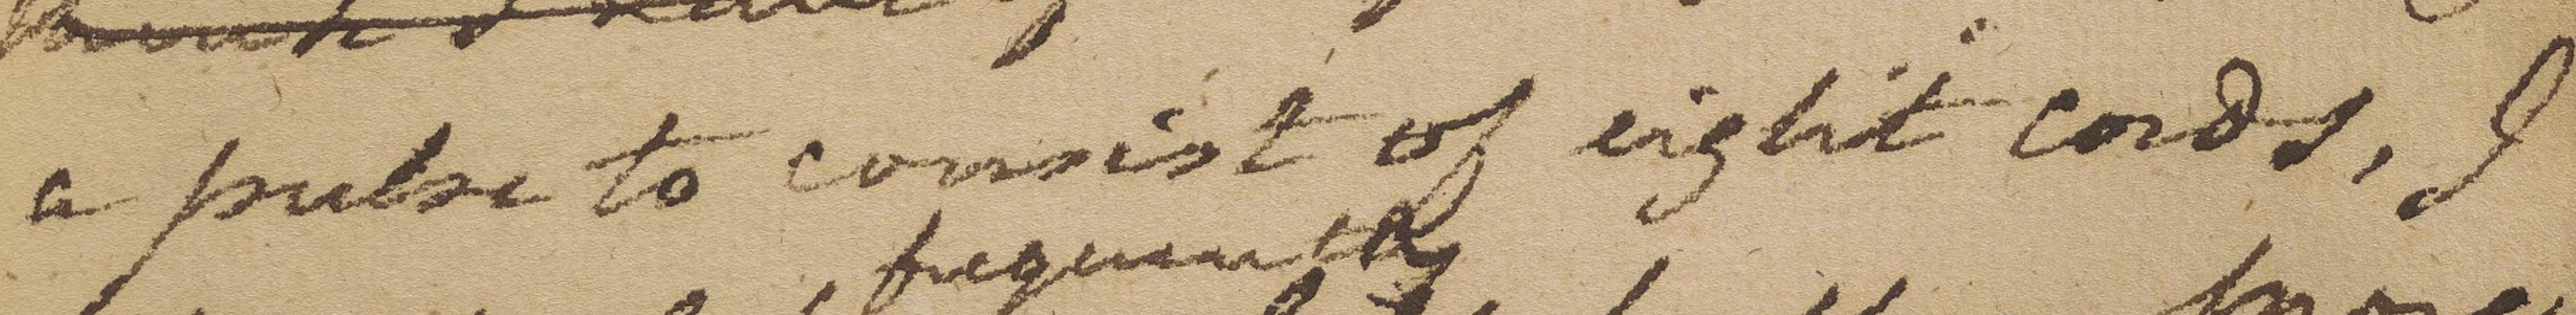a pulse ot consist of eight cords, I
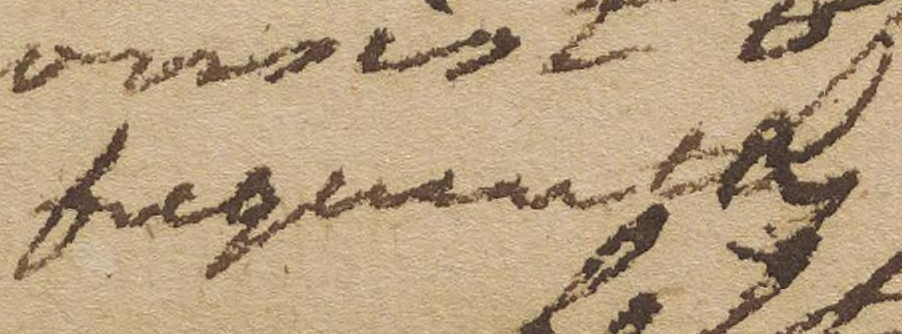frequently
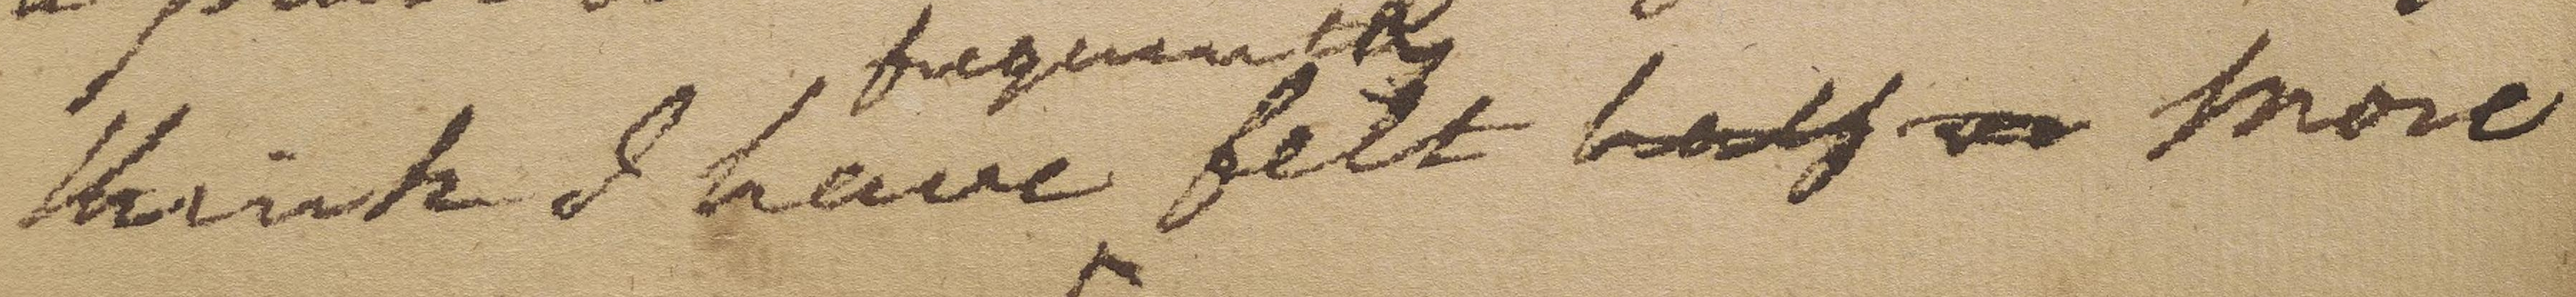think I have ^ felt half [or] more
